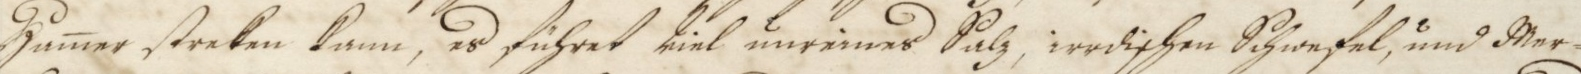Hammer streken kann, es führet viel unreines Salz, irrdischen Schwefel, und Mer-
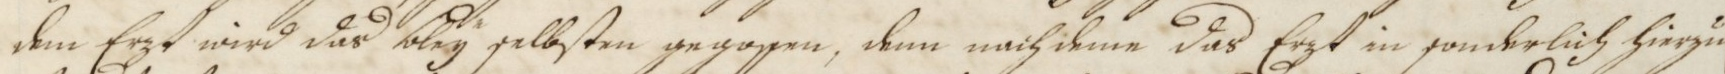dem Erzt wird das Bley selbsten gegossen, denn nach deme das Erzt in sonderlich hierzu
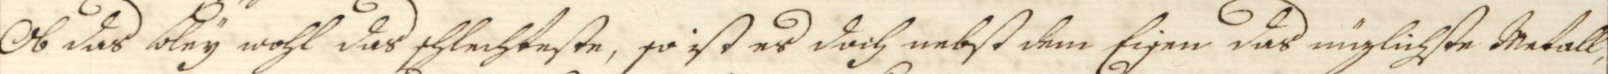Ob das Bley wohl das schlechteste, so ist es doch nebst dem Eisen das möglichste Metall,
